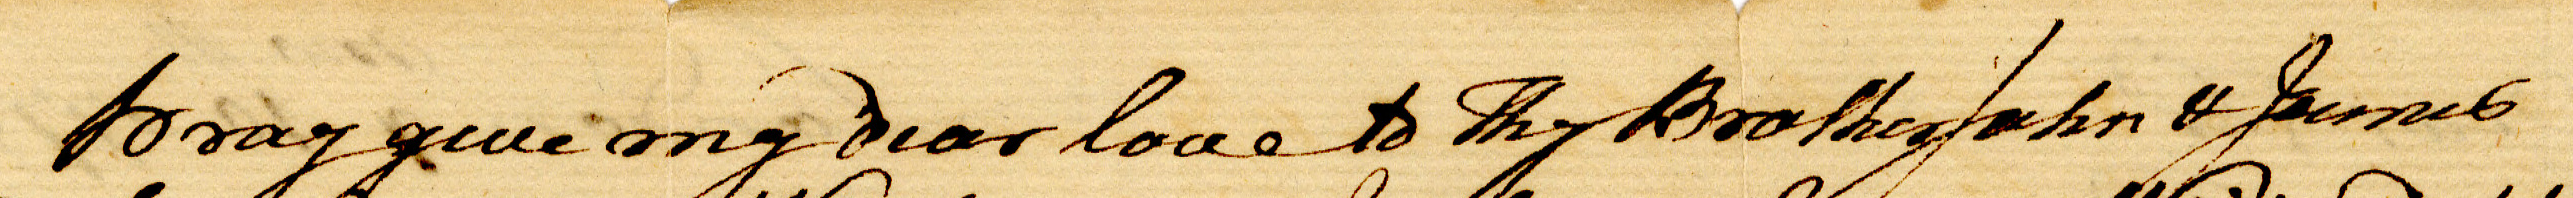pray give my dear love to Thy Brother John & James
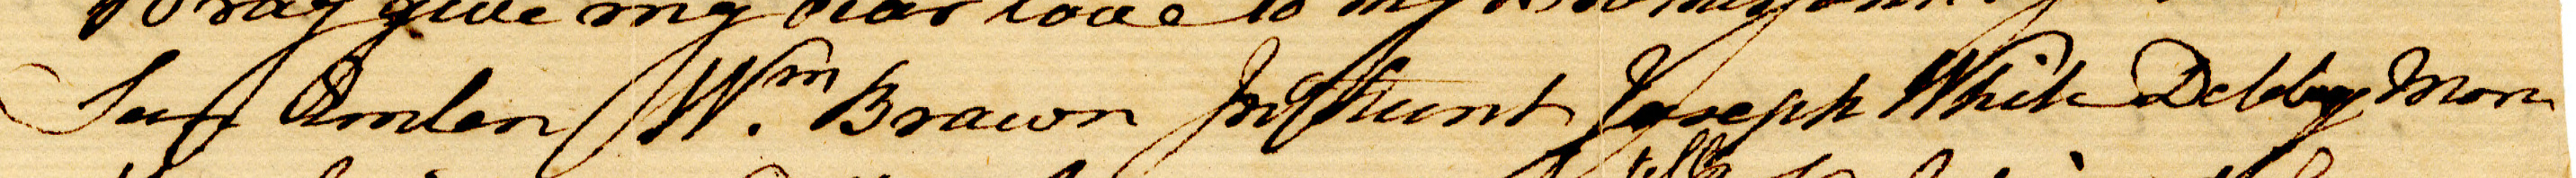Sam Emlen W^m. Brown Jn^o Hunt Joseph White Debby More
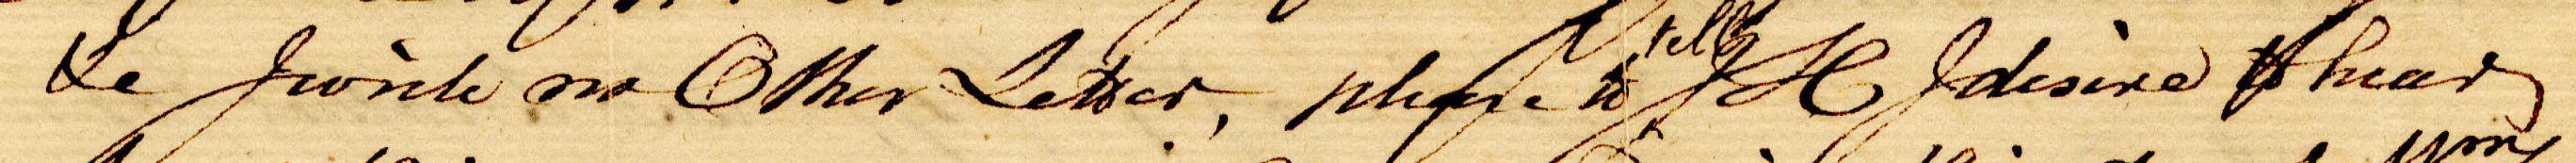& I write no Other Letter, please to ^tell JH I desire to hear
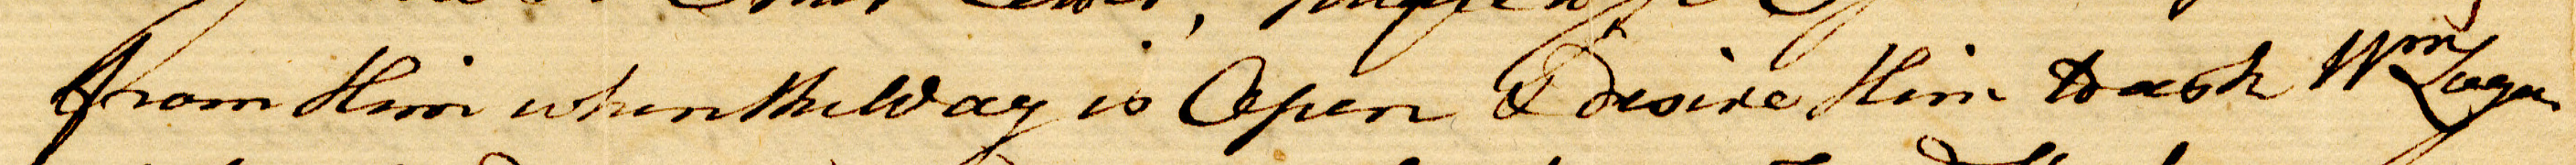from Him when the way is Open & desire him to ask W^m Logan
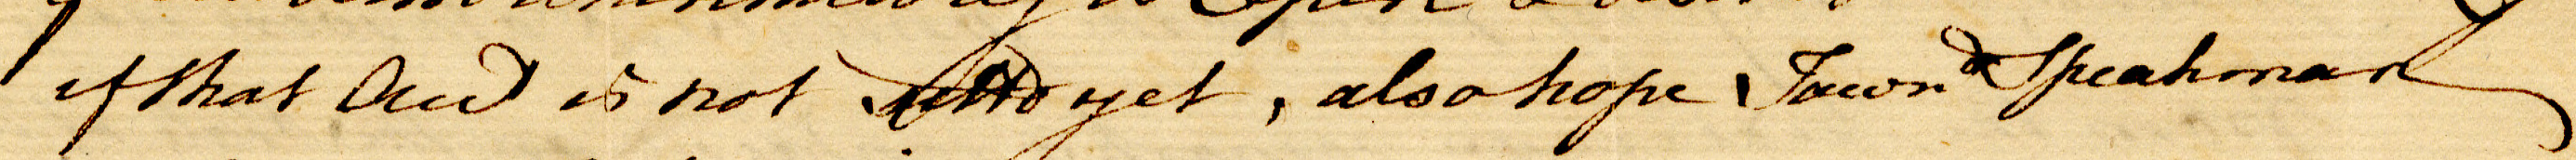if that Acc^t is not recd yet, also hope Town Speakman
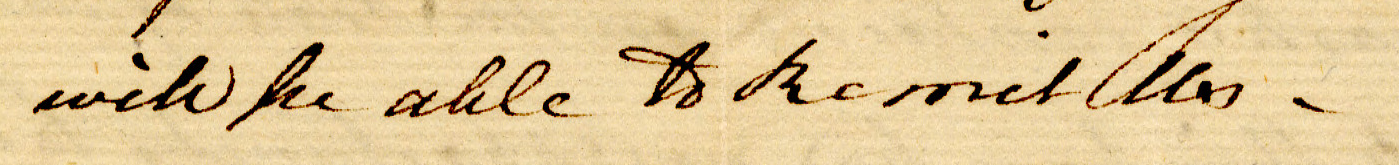will be able to Remit Us.
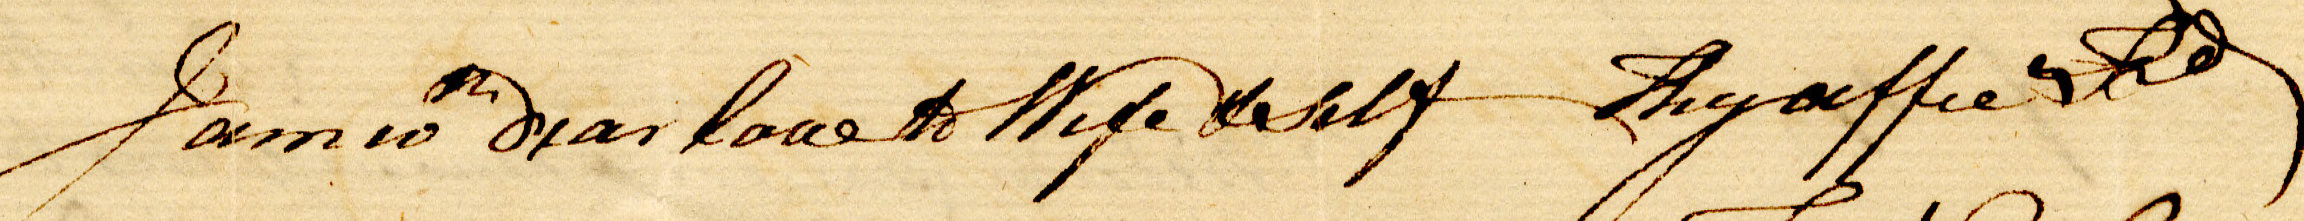I am w^th dear love to Wife & self Thy affect
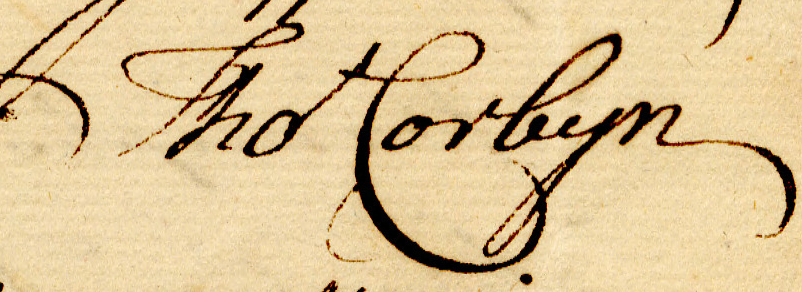Tho Corbyn
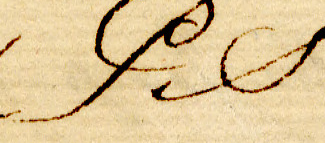PS
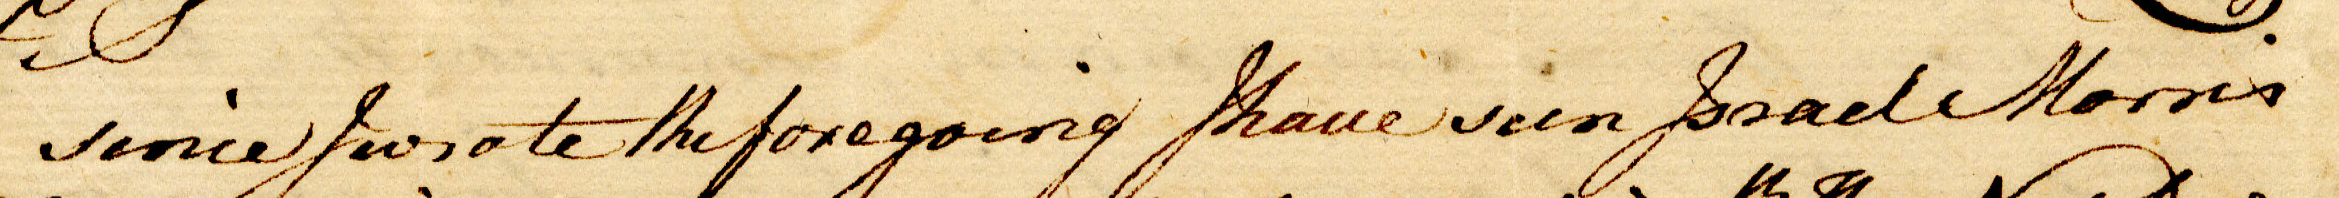since I wrote the foregoing I have seen Israel Morris
